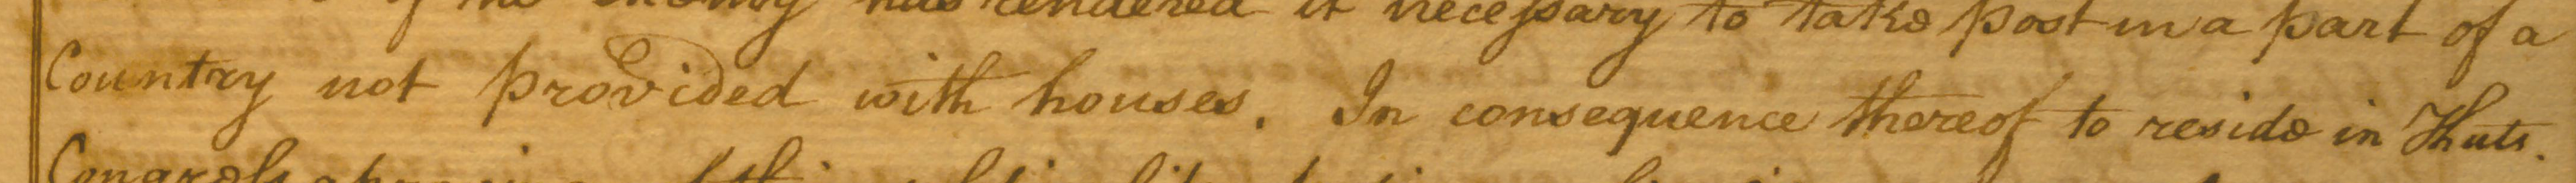Country not provided with houses. In consequence thereof to reside in Huts.
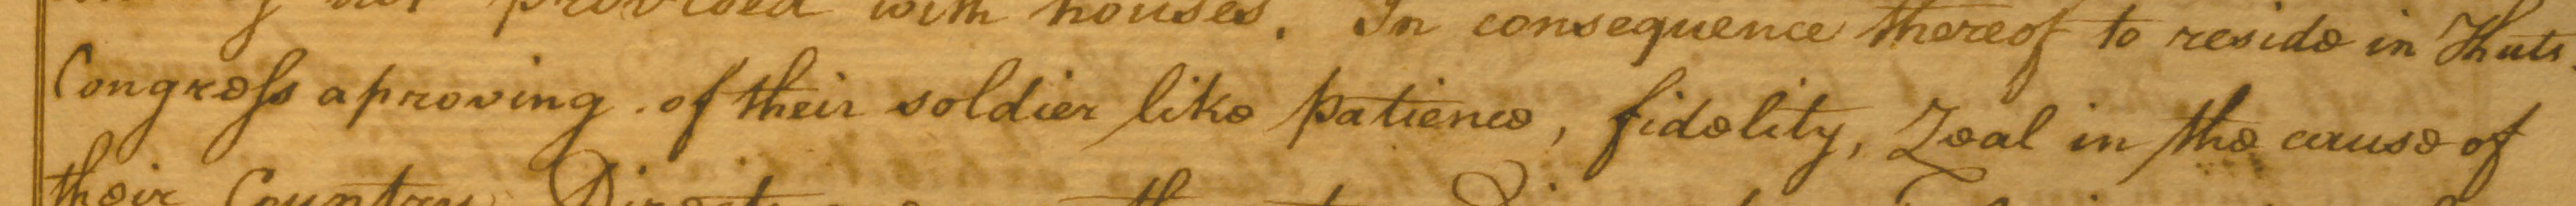Congress approving of their soldier like patience, fidelity, Zeal in the cause of
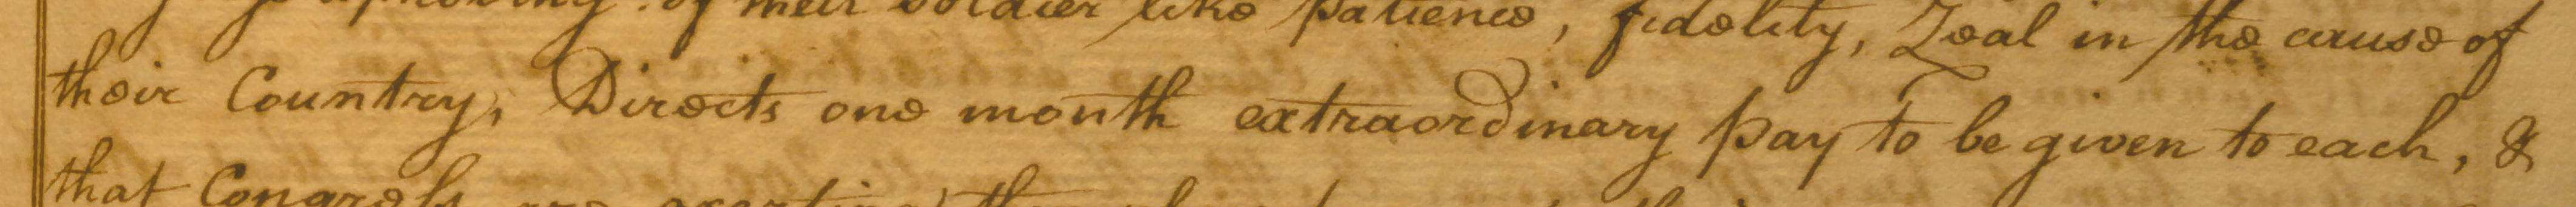their Country, Directs one month extraordinary pay to be given to each, &
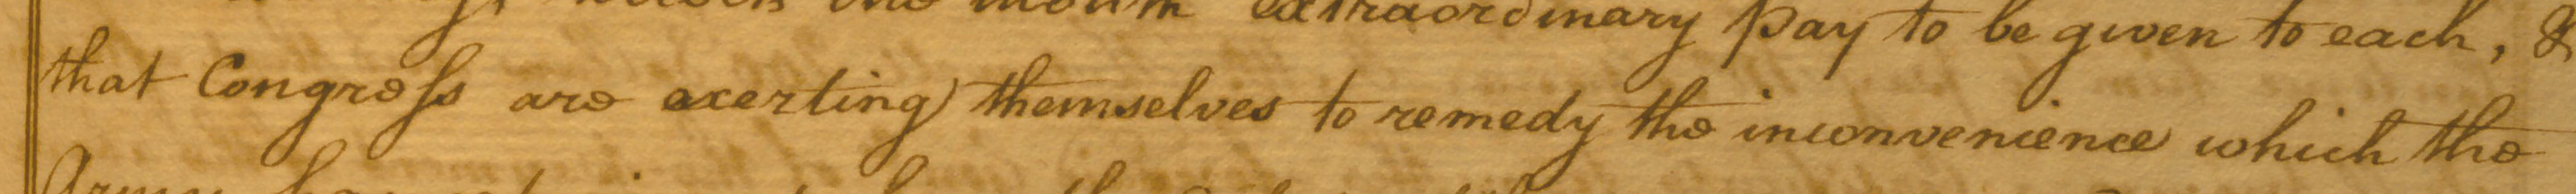that Congress are exerting themselves to remedy the inconvenience which the
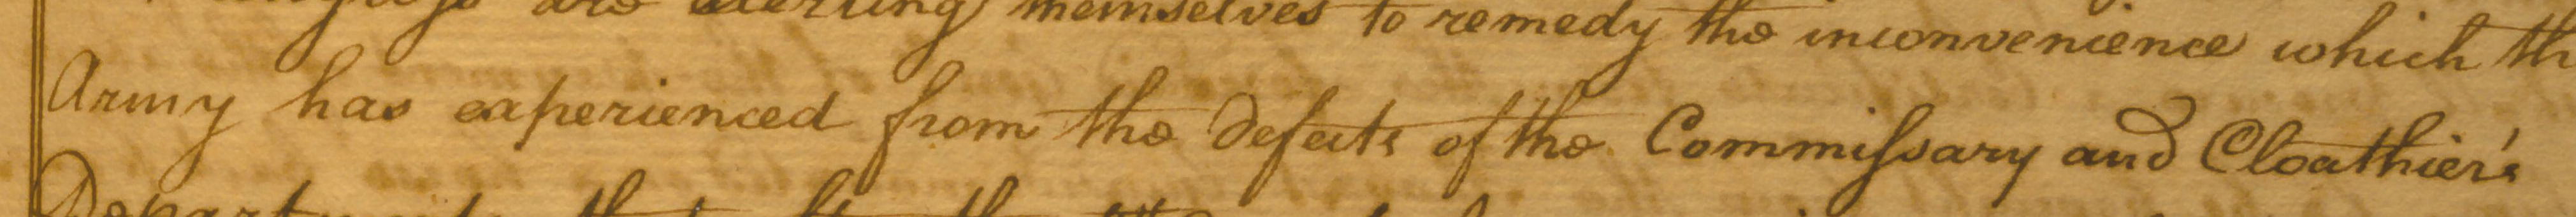Army has experienced from the defects of the Commissary and Cloathier's
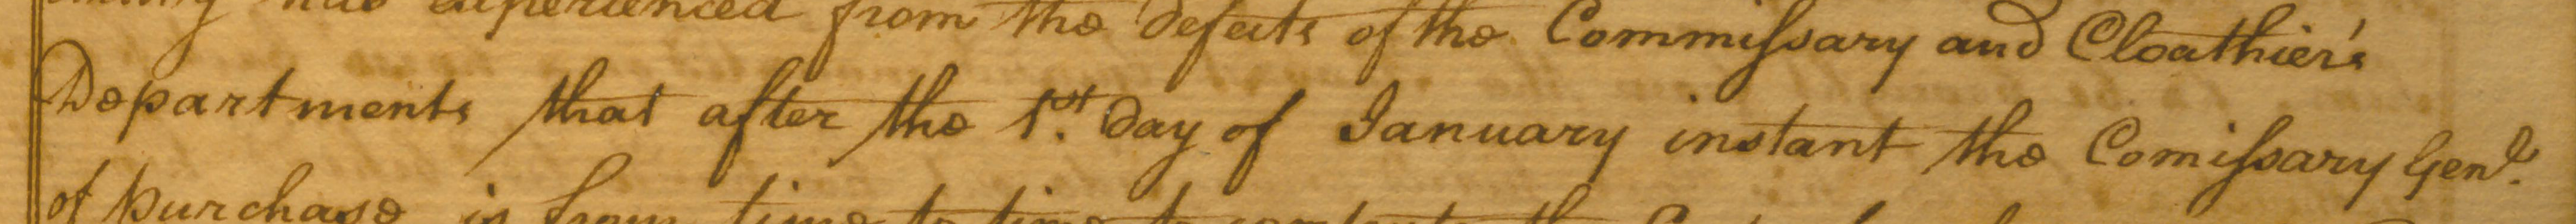Departments that after the 1^st. day of January instant the Comissary Gen^l.
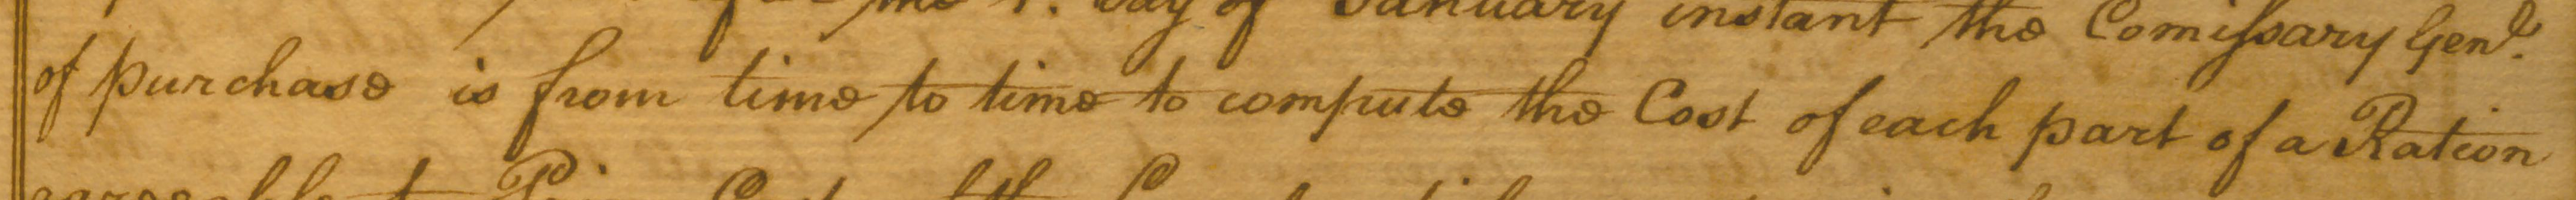of purchase is from time to time to compute the Cost of each part of a Ration
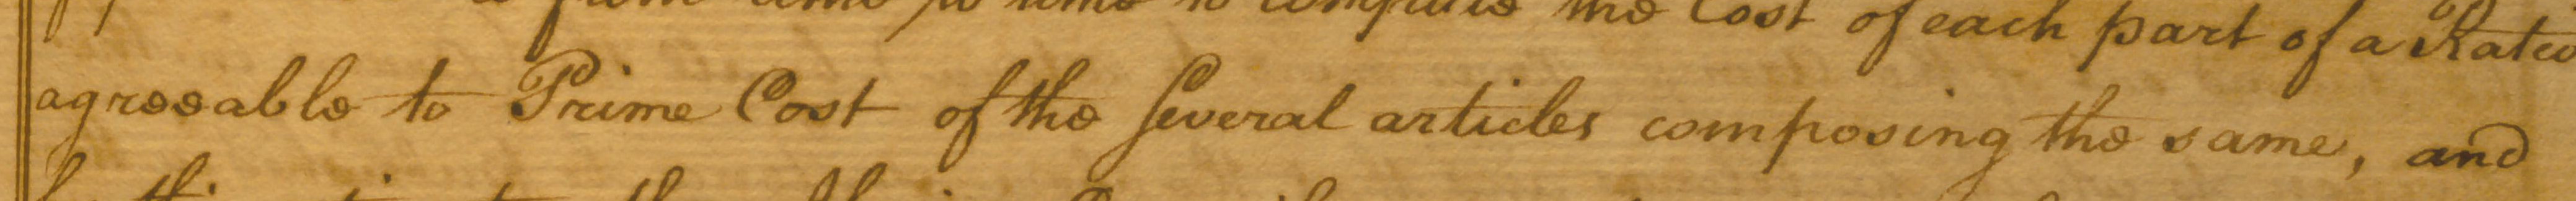agreeable to Prime Cost of the Several articles composing the same, and
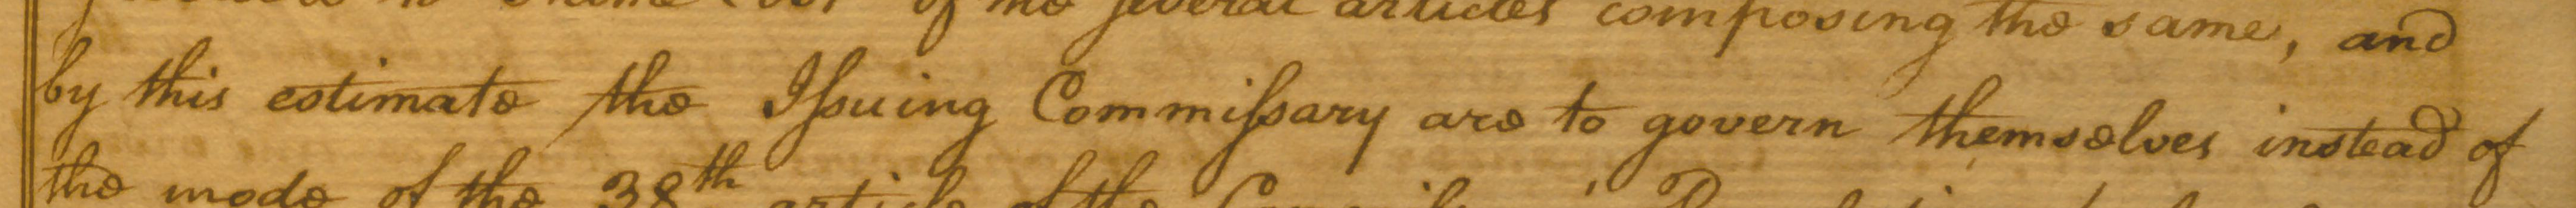by this estimate the Issuing Commissary are to govern themselves instead of
